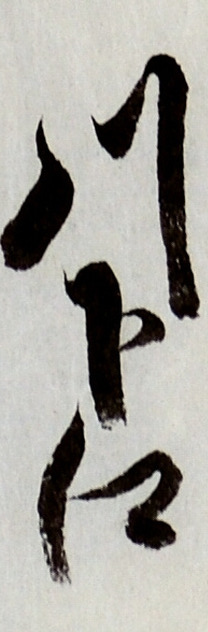川下郷
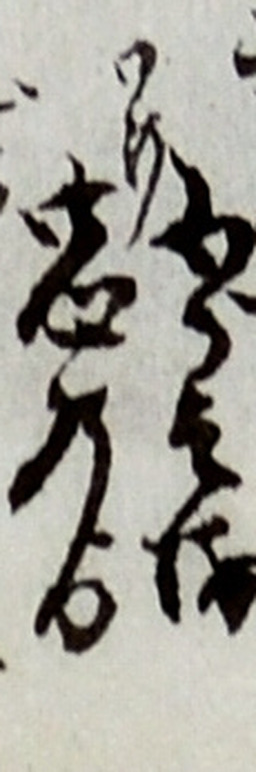忠左衛門
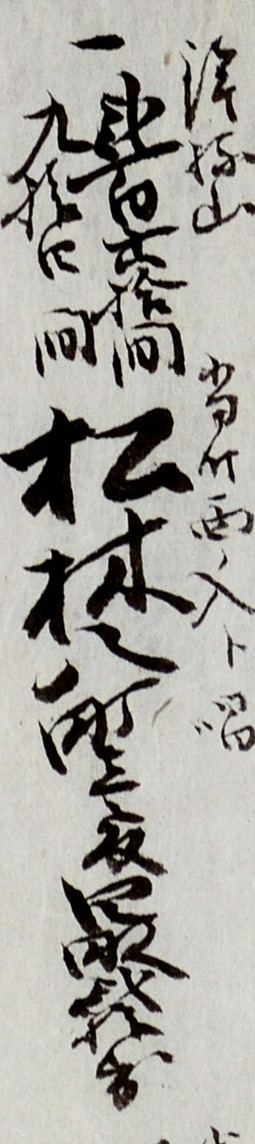一弐百六拾間松林八町壱反四畝弐拾歩山守頭取
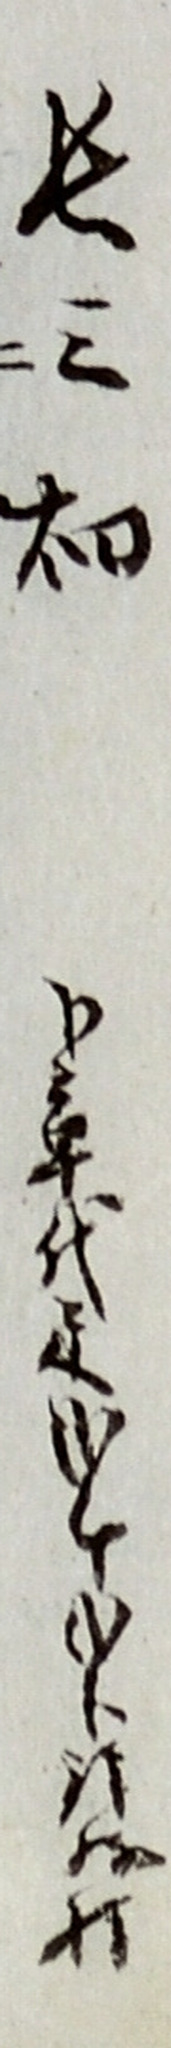長三畑下草代米弐斗弐升鉾持村
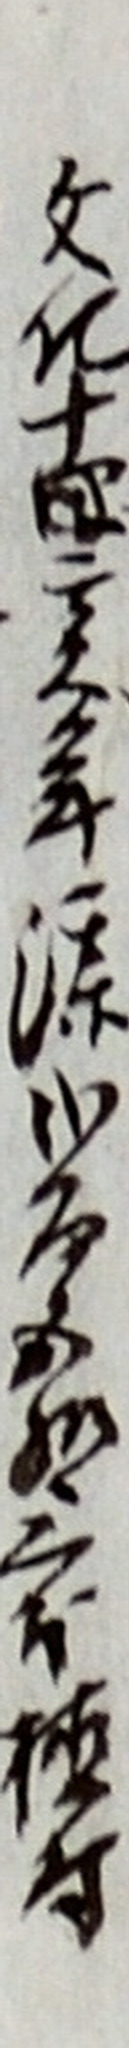文化十二亥年漆弐百五拾三本植付
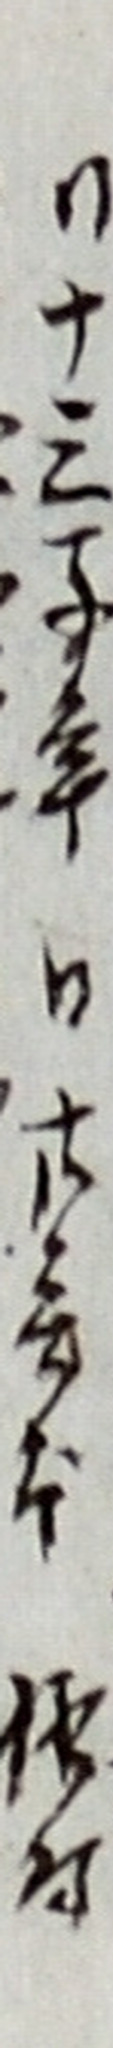同十三子年同廿壱本植付
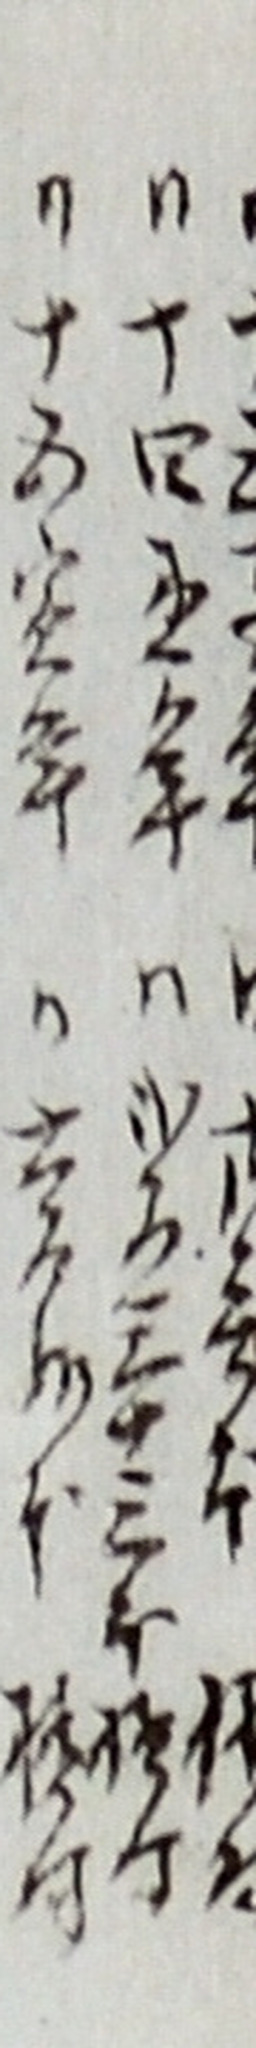同十五寅年同六百弐本植付
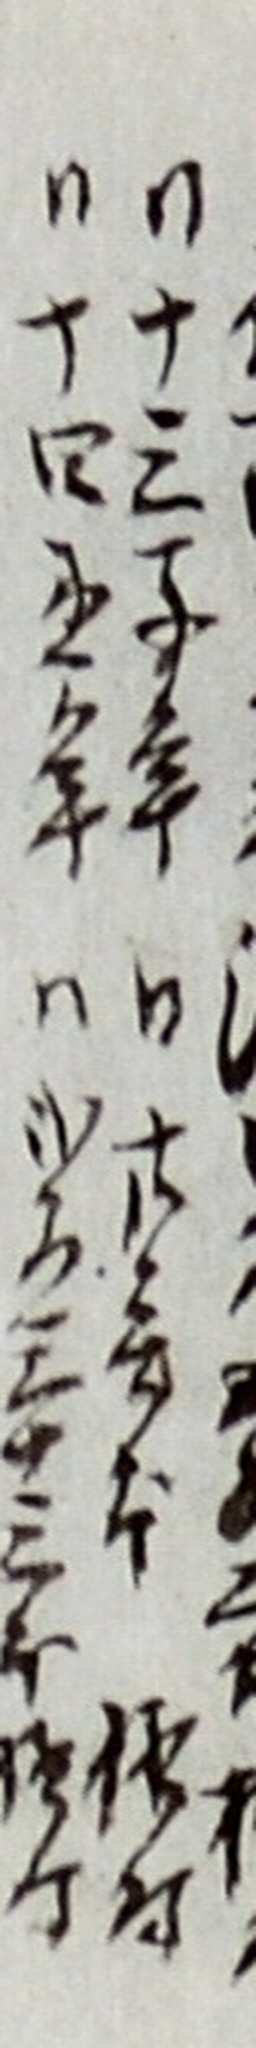同十四丑年同弐百三十三本植付
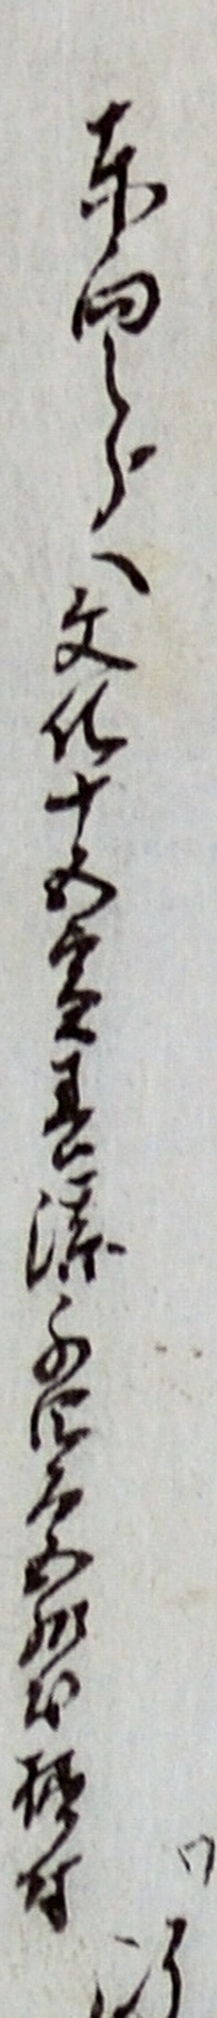東向之分へ文化十五寅春漆千四百五拾本植付

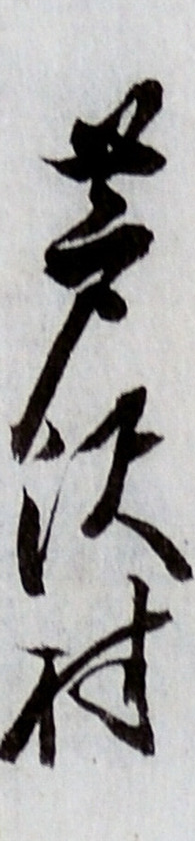芦沢村
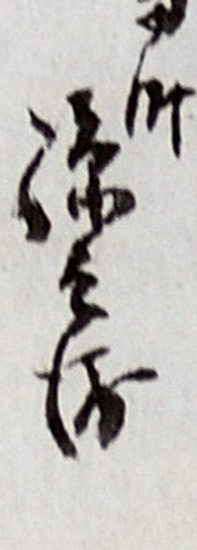伊兵衛
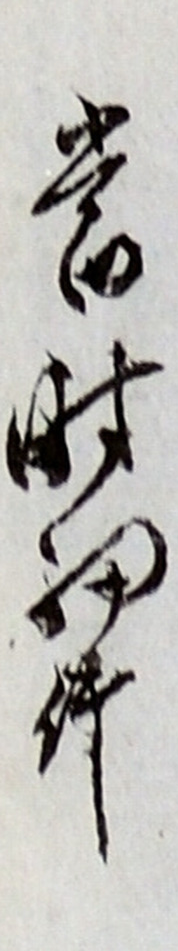当時細竹
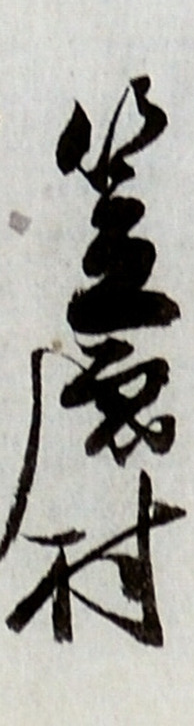笠原村
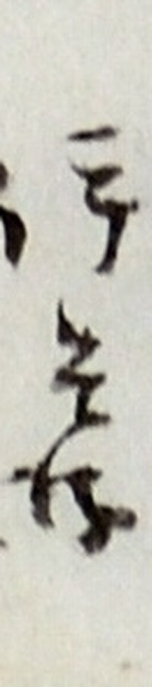伊兵衛
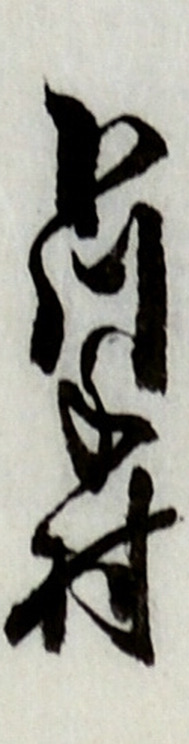下川手村
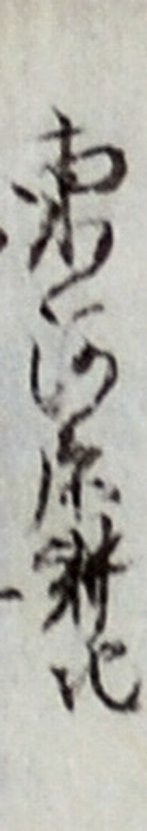東河原耕地
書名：御立山控
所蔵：伊那市立高遠町図書館・合同会社AMANE
